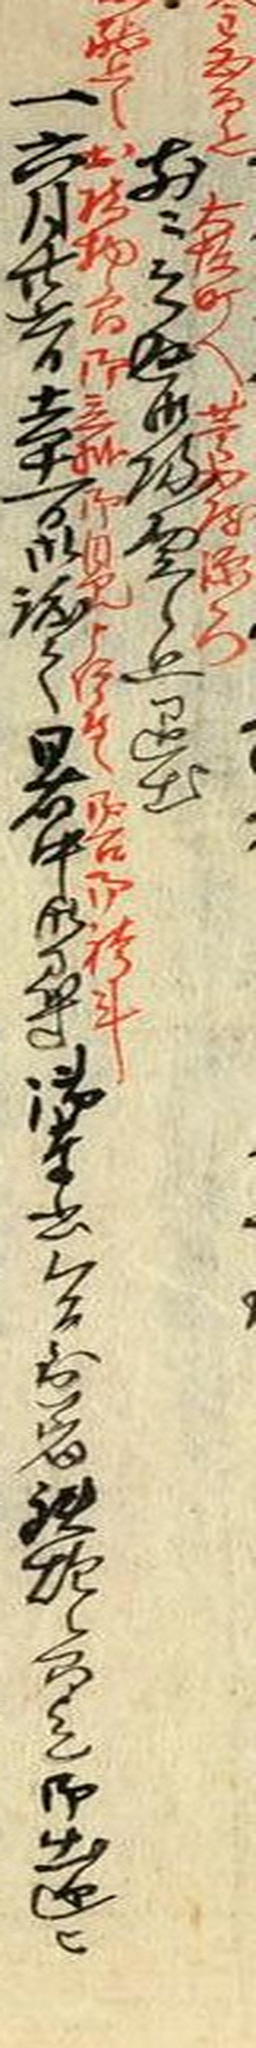一六月廿六日去十一日御渡之暑中御尋御奉書今日到着鉄炮之間迄御出迎被
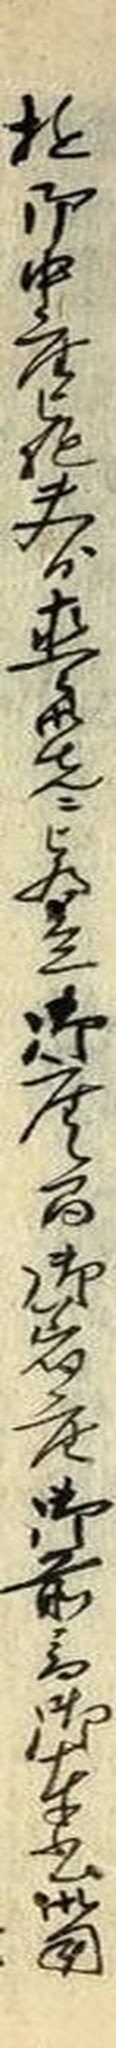遊御中座被遊夫ゟ直々御先ニ被為立御座之間御着座御前ニ而御奉書御用
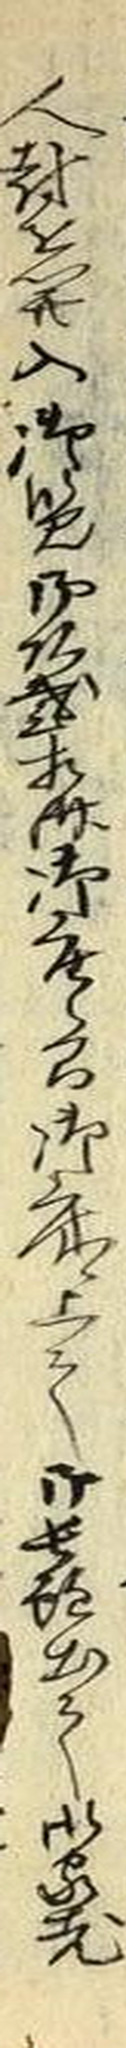人封を開入御覧御頂戴相済御座之間御床へ上之御長鮑出之御家老
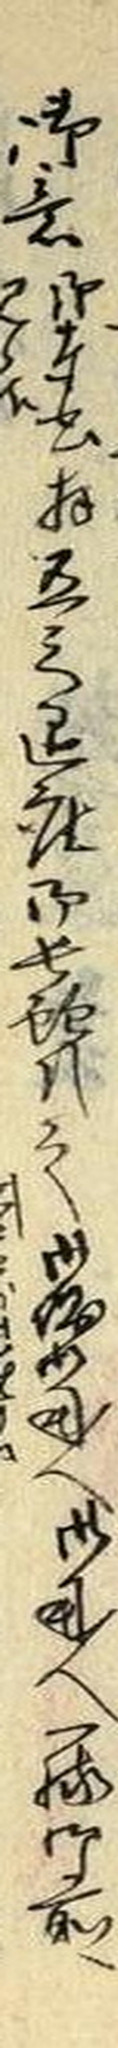御意御奉書拝見候様有之退座御長鮑引之御側御用人御用人一統御前へ
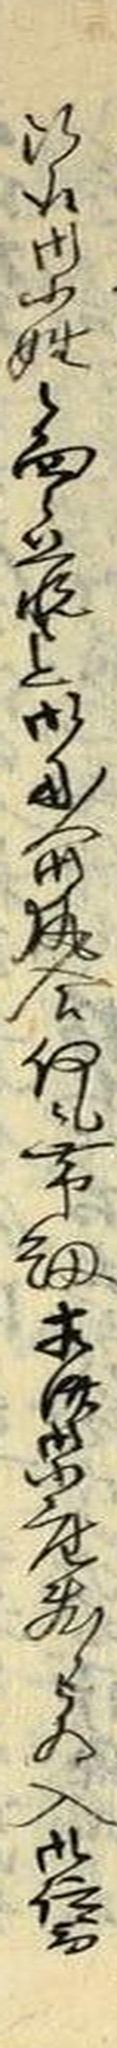頭取御小姓之面々恐悦申上御用人御執合何も帯剣相済御小座敷へ被為入御仰ニ而
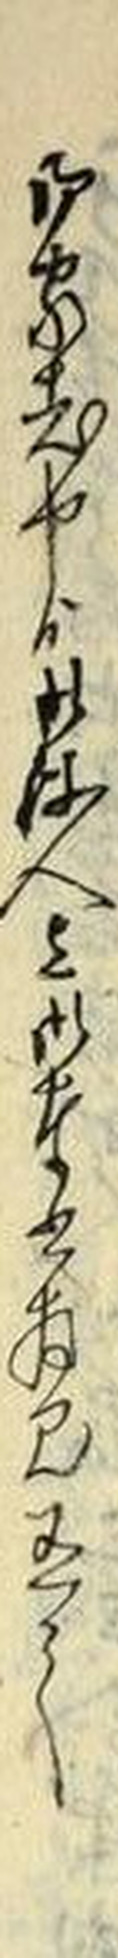御家老中ゟ御役人迄御奉書拝見有之
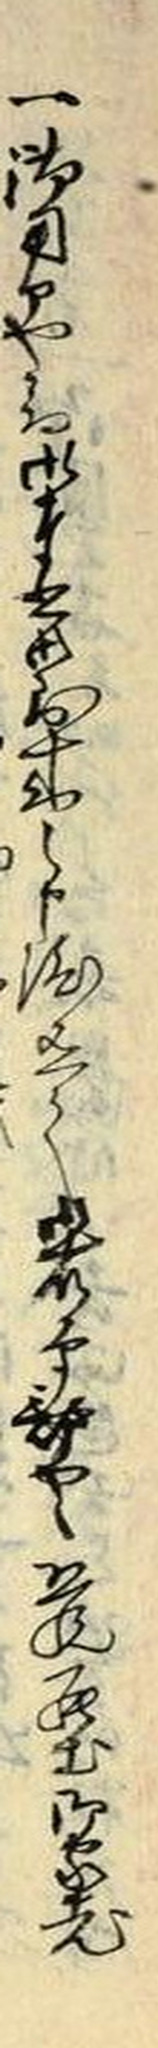一御用部やニ而御奉書御到来之申渡有之御右筆部やへ恐悦罷出御家老
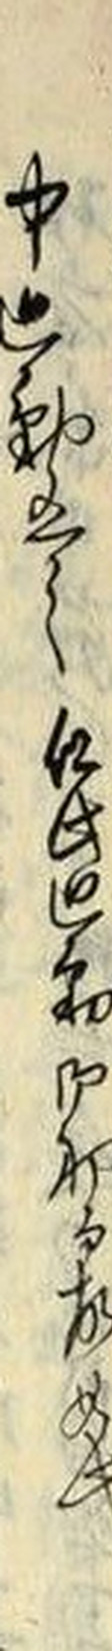中廻勤有之但此廻勤御初而故如此
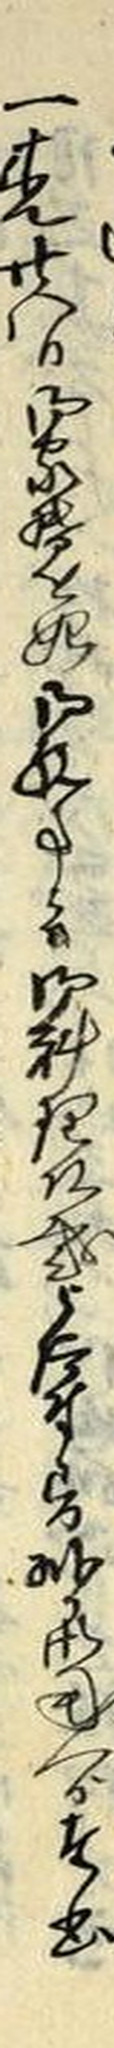一来ル廿八日御家督を始御祝事ニ付御料理頂戴被仰付候旨御用人ゟ奉書
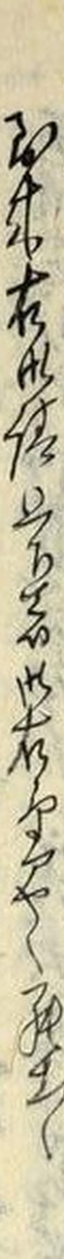到来右御請上下着御右筆部やへ罷出候
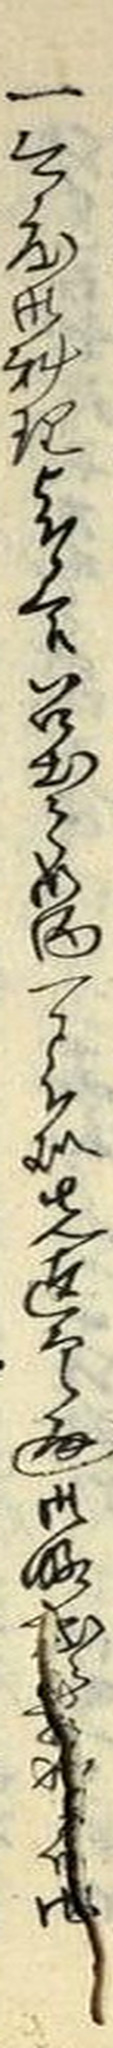一今度御料理被下候節召出之御酒可被下候処先達而之通御略式ニ相成候ニ付御
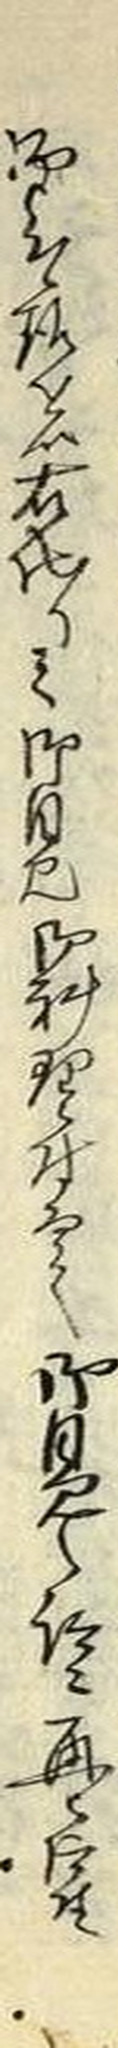酒被下候趣を以右代り之御目見御料理ニ付而之御目見之跡ニ再被仰付候
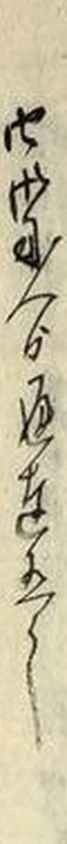由御用人ゟ通達有之
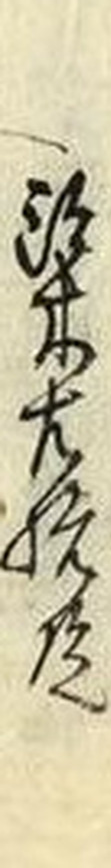鈴木左善殿
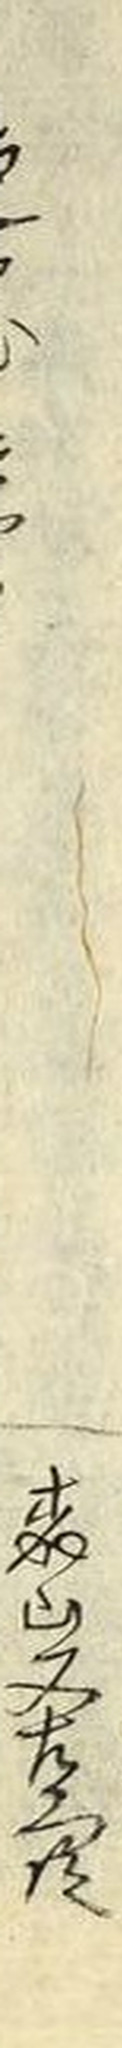御帯地壱筋ツヽ森山又左衛門殿
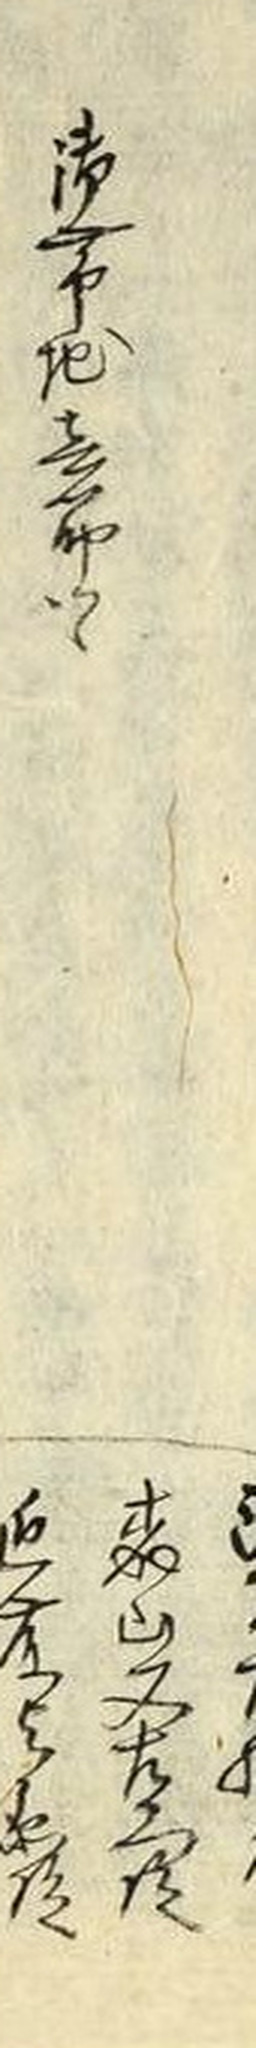御帯地壱筋ツヽ森山又左衛門殿
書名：少傅日録抄（斉善付側向頭取日記、江戸并道中、初入在国、逝去後…
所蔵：福井県文書館 Fukui Prefectural Archives
